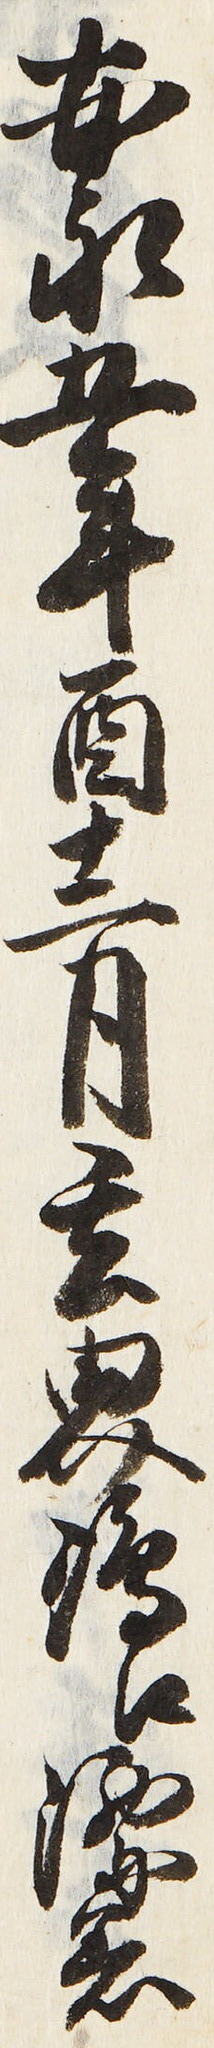安永五年酉十二月玄界嶋江漂着
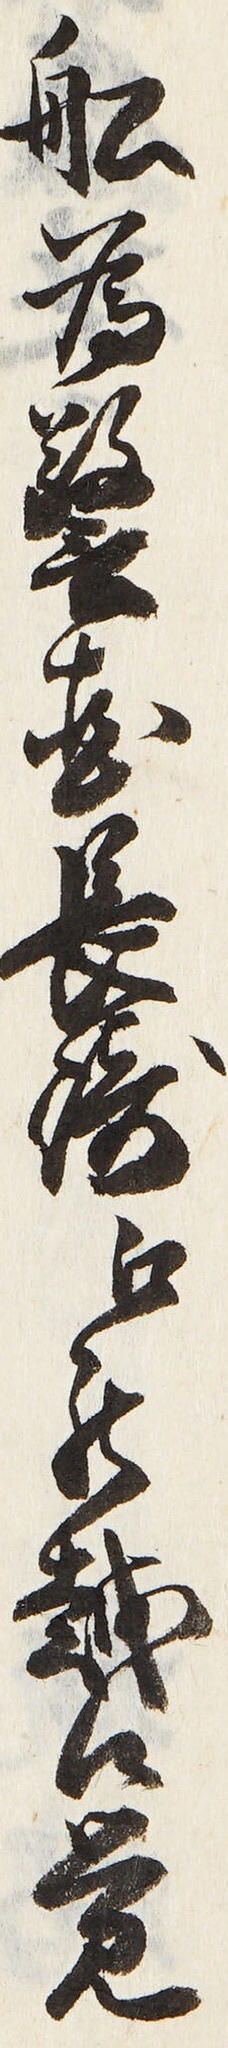船為警固長崎江罷越候覚
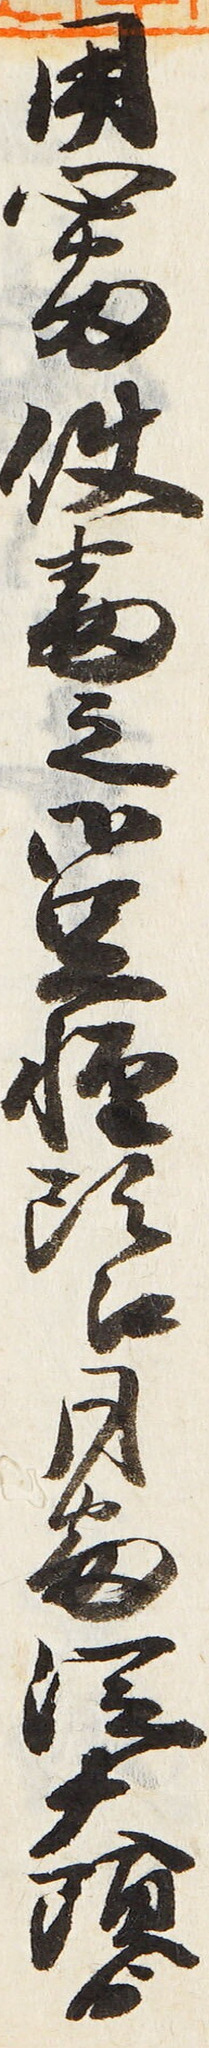一用心番使番之御足軽頭江月番従大頭ゟ
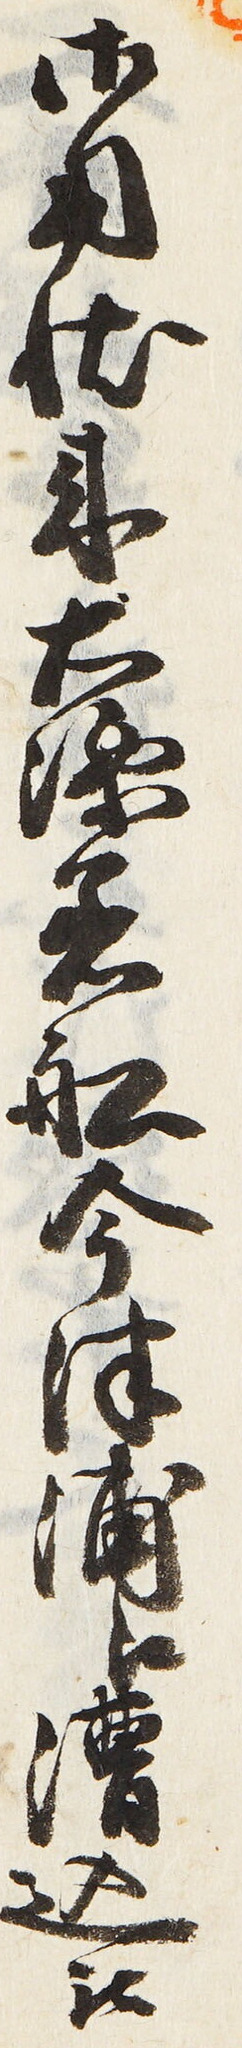御用状来右漂着船今津浦江漕込被
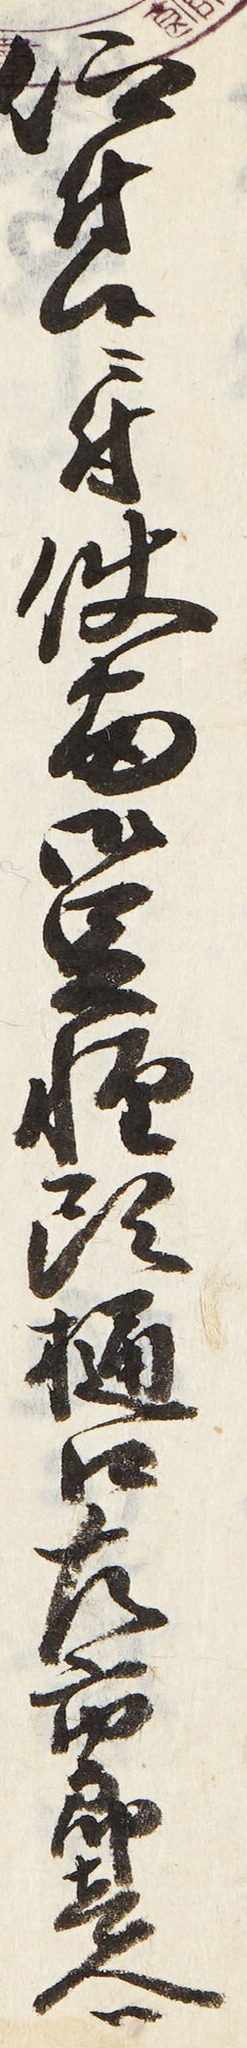仰付候ニ付使番御足軽頭樋口左市郎壱人ハ
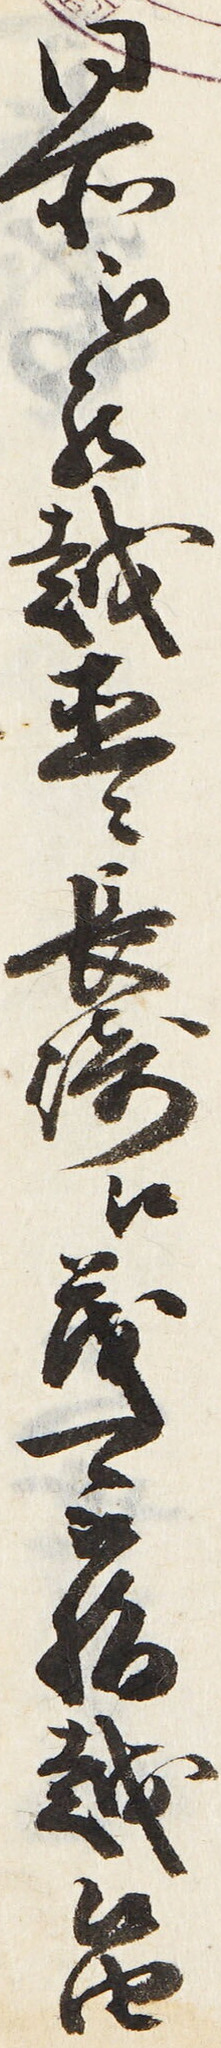同所江罷越直ニ長崎江も可被指越候由
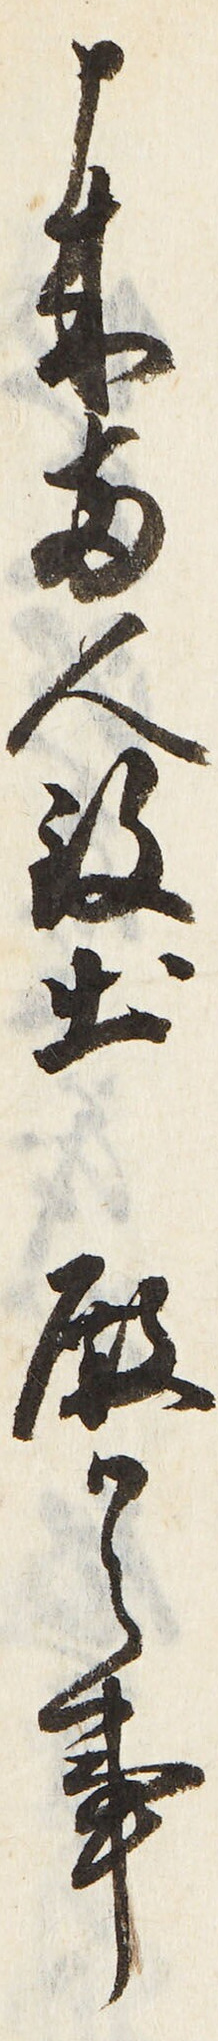申来両人致出殿候之事

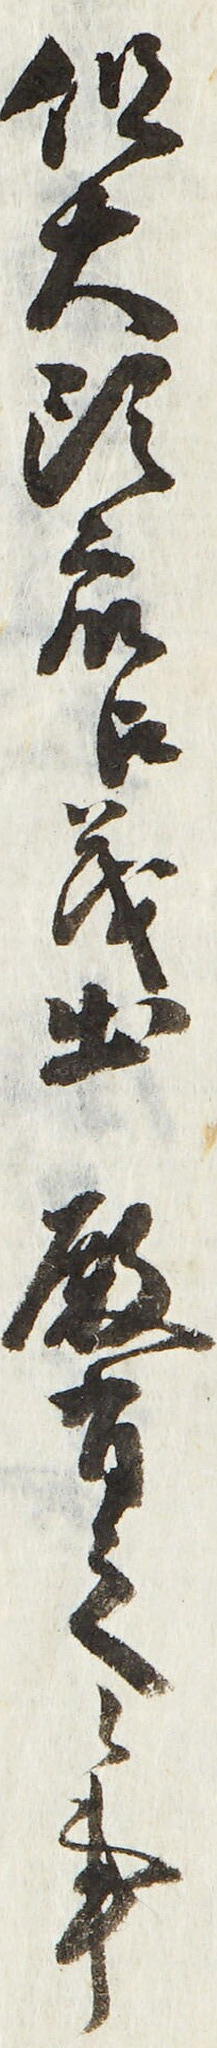但大頭衆江も出殿有之候事
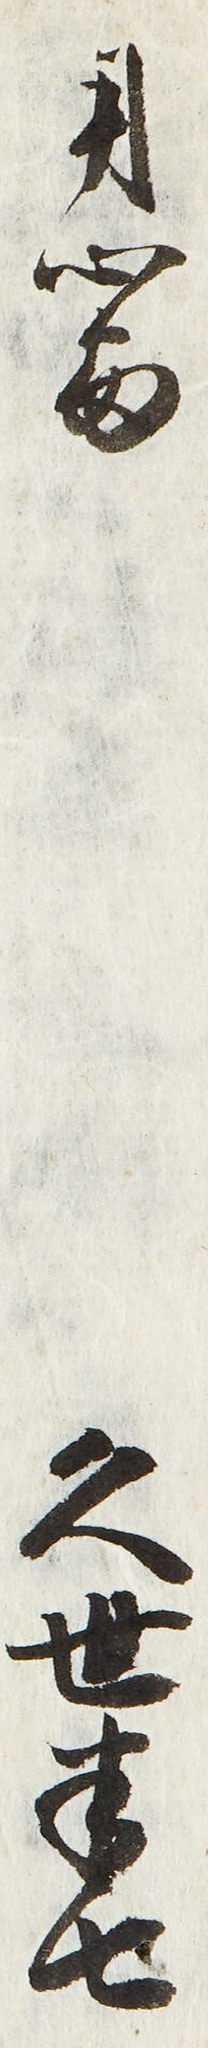用心番久世半七
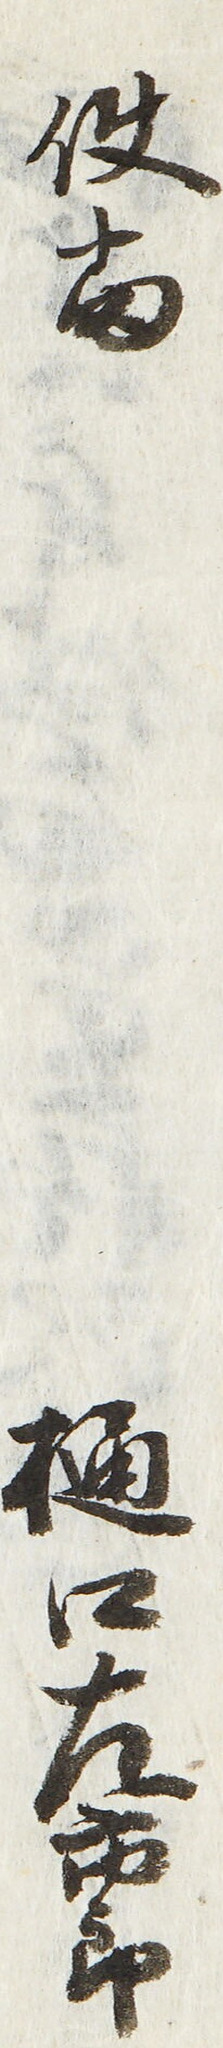使番樋口左市郎
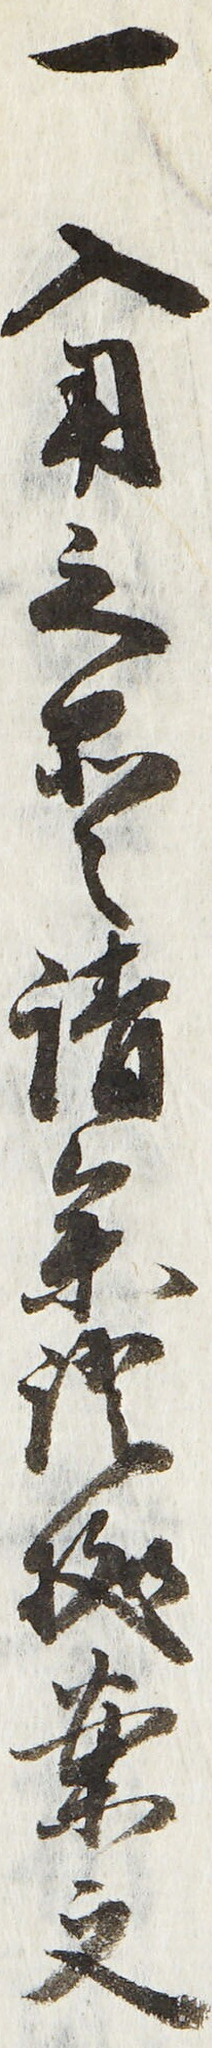一入用之品々請参証拠案文
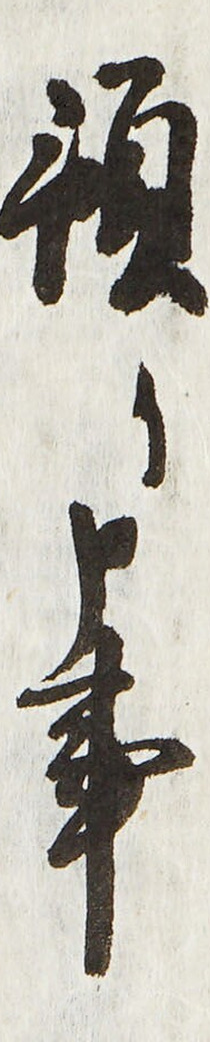預り申事
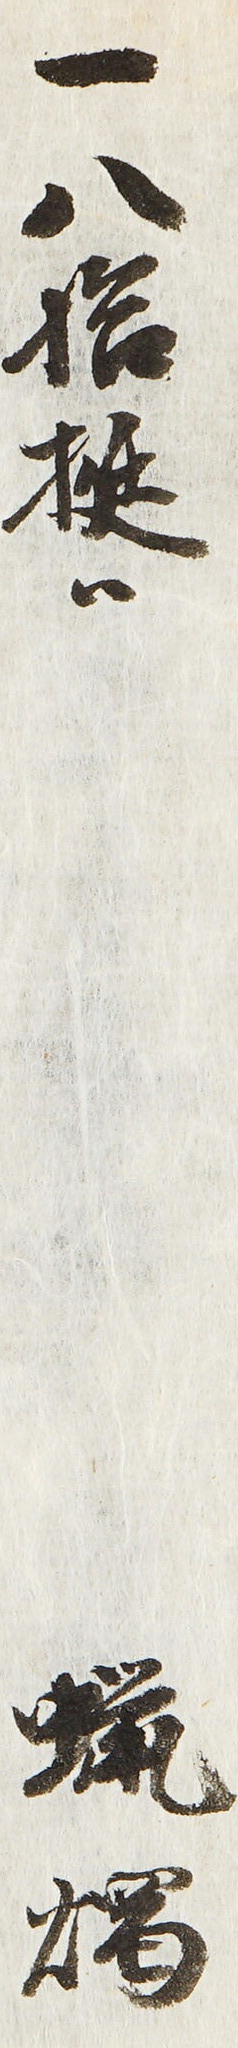一八拾挺ハ蝋燭
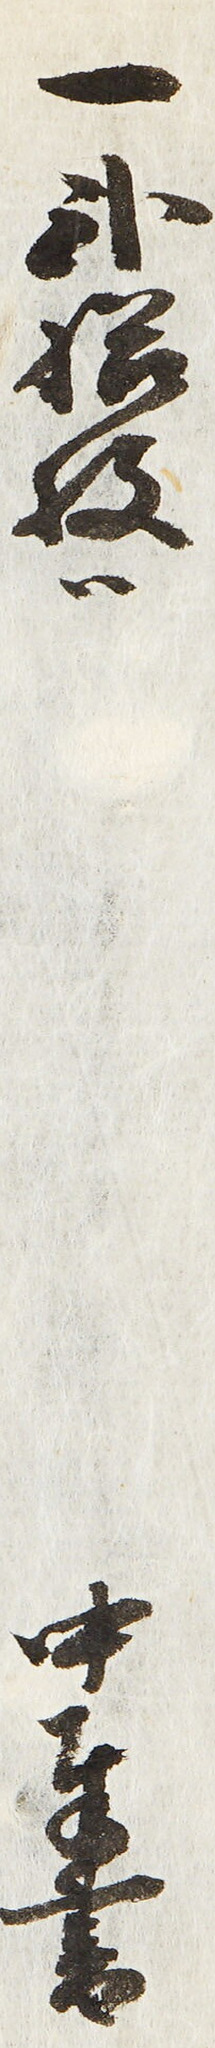一弐拾枚ハ中奉書
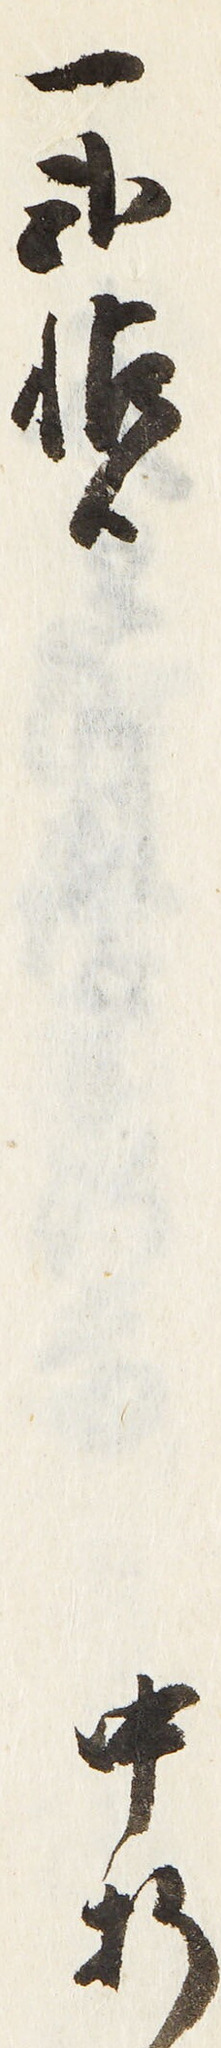一弐帖ハ中折
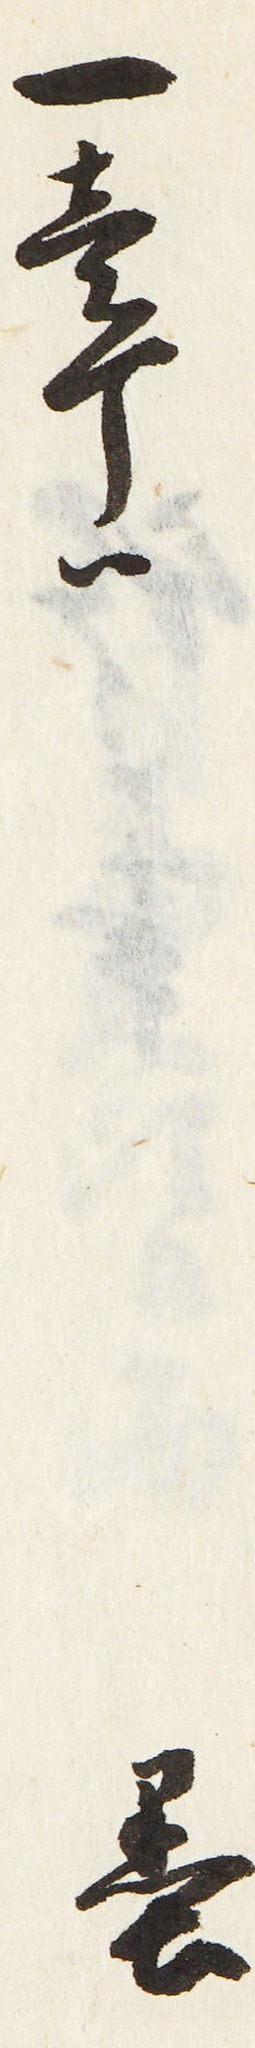一壱丁ハ墨
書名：玄海嶋江漂着船為警固長崎江被越候覚
